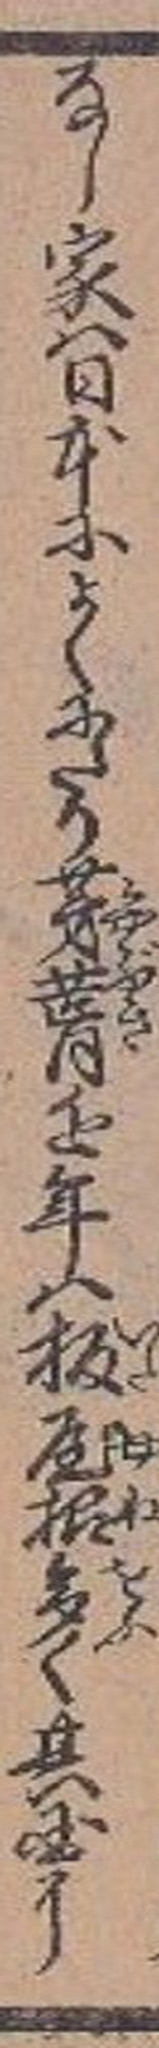なし家は日本によくにたり茅葺近年は板屋根多く其国に
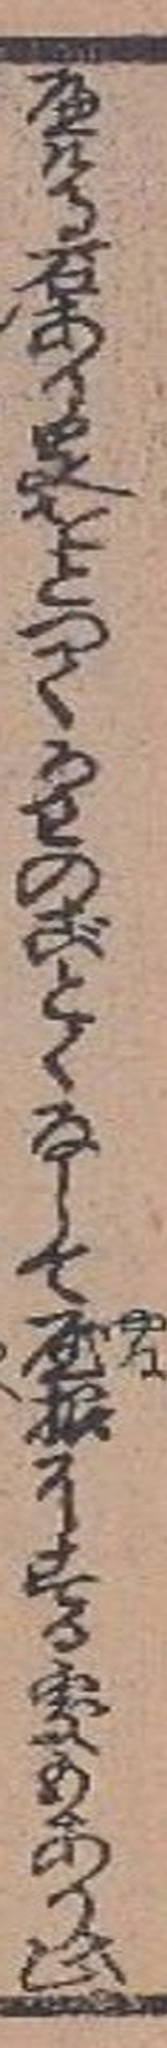へける石あり是をとつてかわのごとくなして屋根にする処もあり此
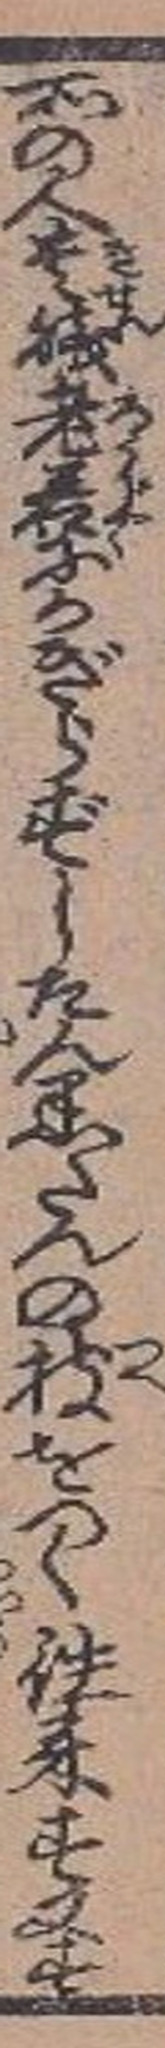所の人貴賎老若にかぎらずしたん黒たんの杖をつく往来す又す
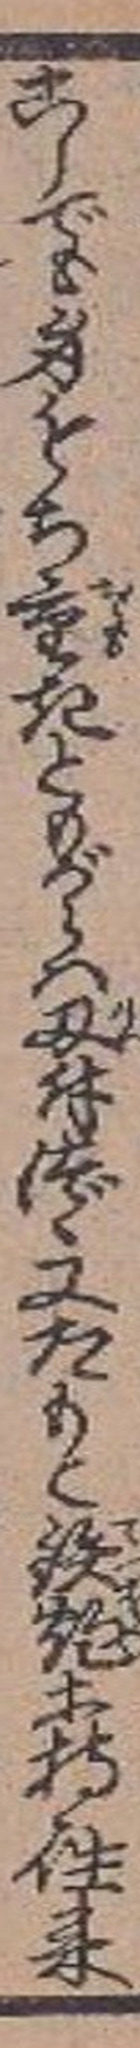こしでも身もち重きともがらは刃付づゝ又たもと鉄砲等持往来
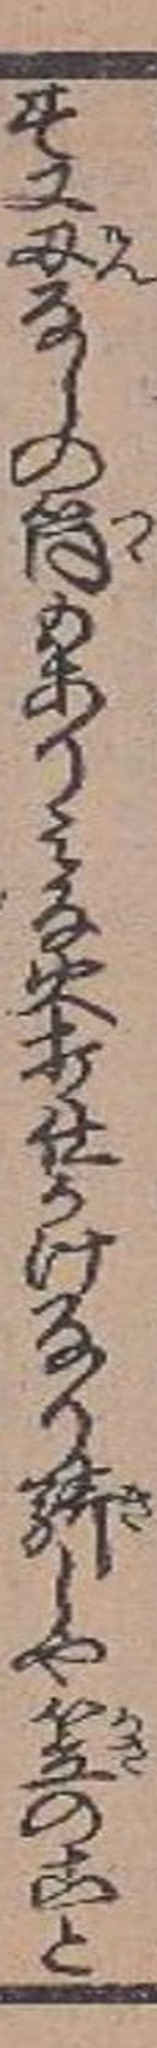す又刃なしの筒もありみな火打仕かけなり騎？しや笠のこと
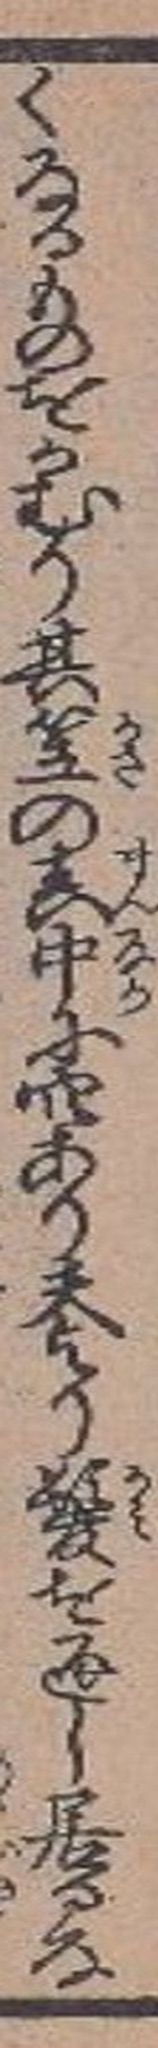くなるものをかむり其笠の真中に穴あり夫より髪を通し居るな
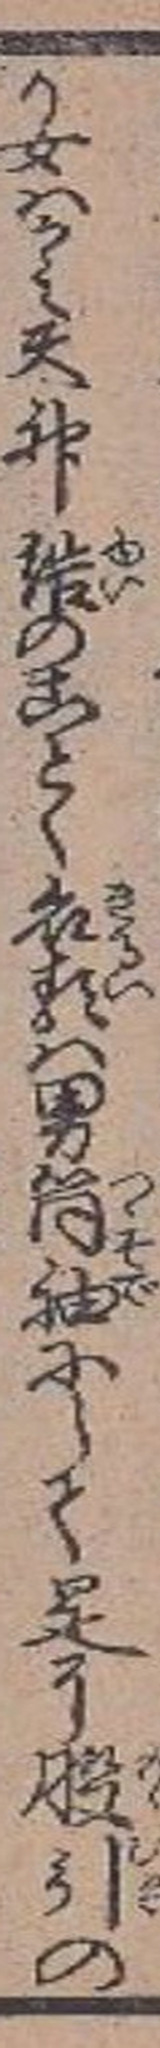り女はかみ天神結のことく衣類は男筒袖にして是に股引の
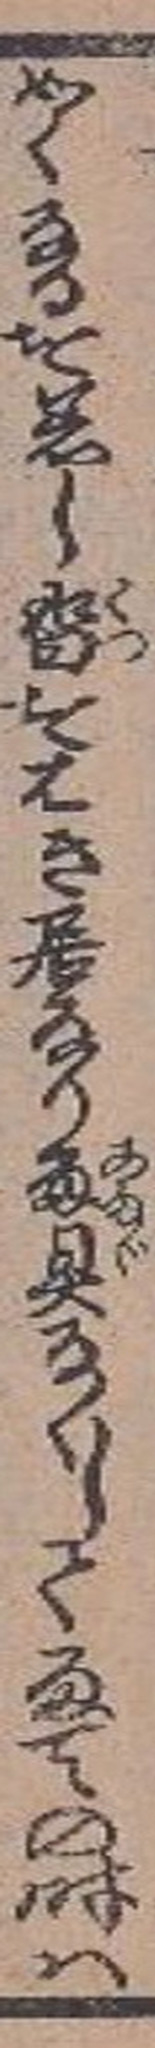如くなるを着し沓をはき居なり雨具なくして雨天の時は
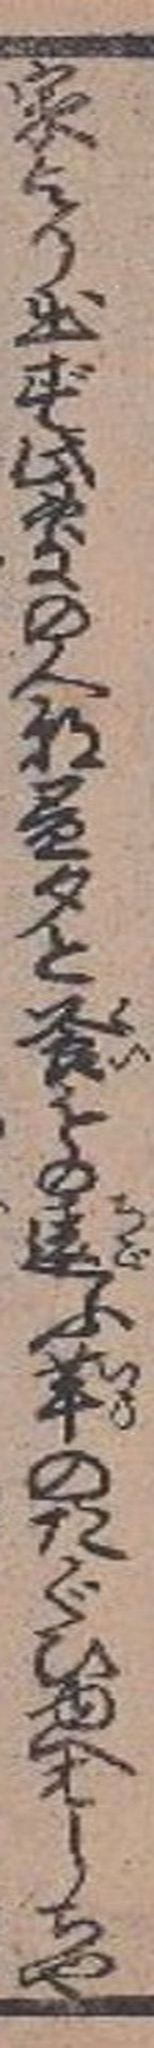家より出ず此処の人朝昼夕と喰もの違ふ芋のたぐひゆへはしちや
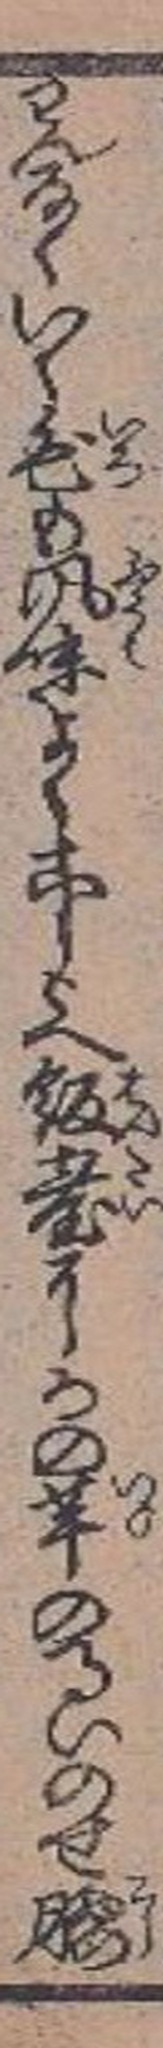わんなくいく色も風味よくこしらへ飯台にかの芋のるいのせ腰
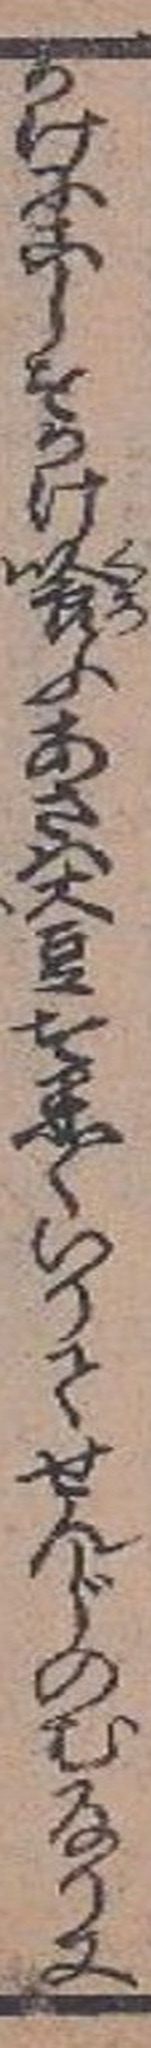かけにこしをかけ喰ふあさは大豆を黒くいりてせんじのむなり又
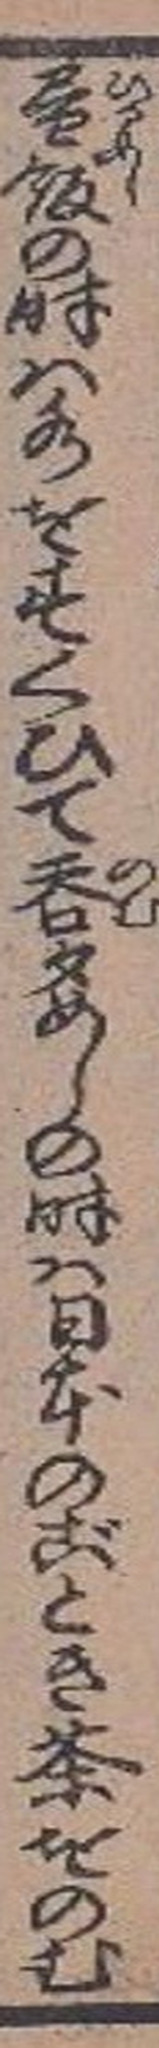昼飯の時は水をすくひて呑夕めしの時は日本のごとき茶をのむ

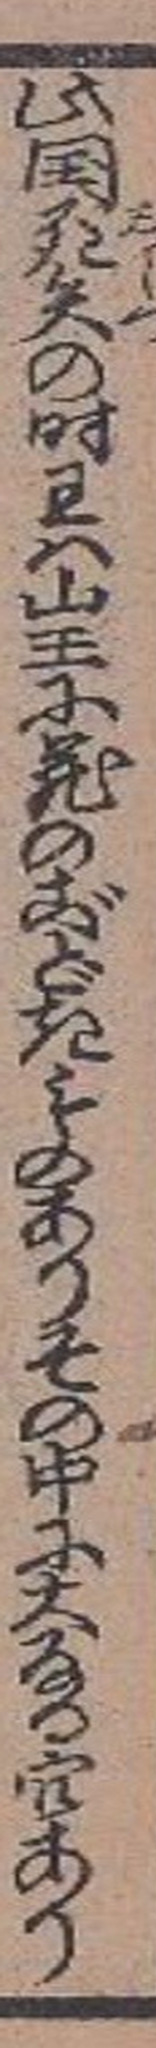此国死失の時王は山王に蔵のごときものありその中に大なる穴あり
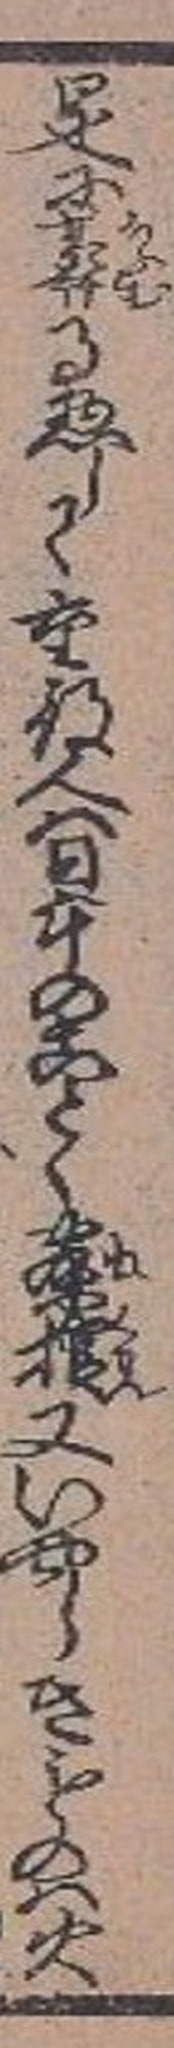是に葬る惣して重役人は日本のことく寝棺又いやしきものは火
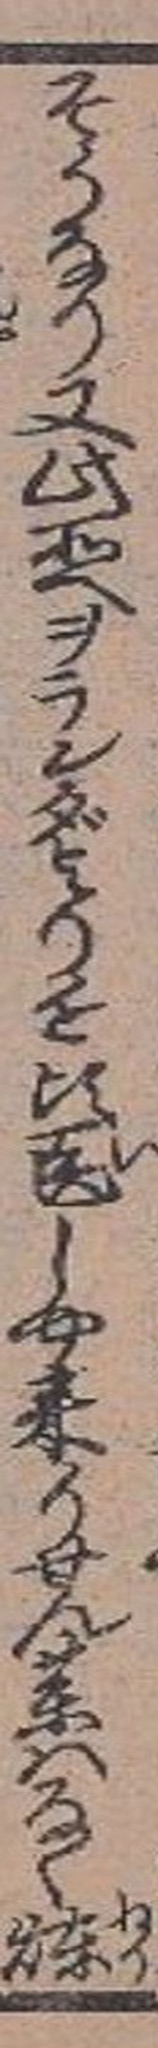そうなり又此処へヲランダより近頃医しや来りせん薬なく煉
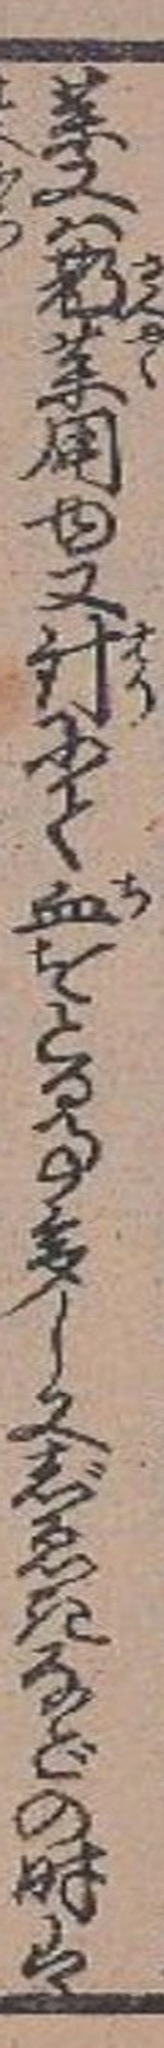薬又は散薬用ゆ又針にて血をとる事多し又じゑきなどの時は
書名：満次郎漂流記
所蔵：University of the Ryukyus Library
